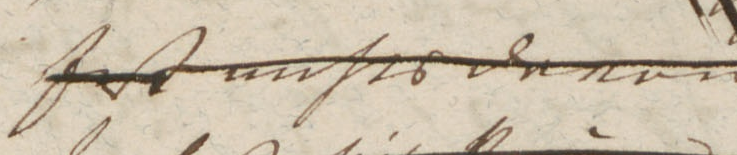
fast nichts davon
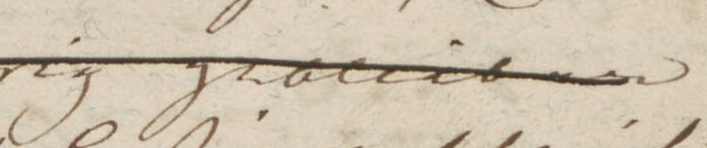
übrig geblieben
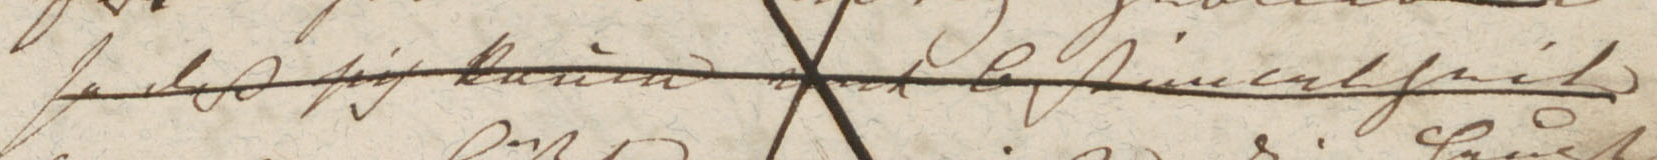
so dass sich kaum mit Bestimmtheit
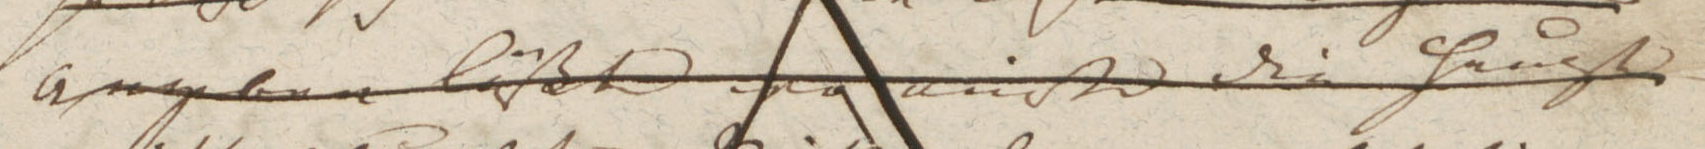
angeben lässt wo nicht die Haupt-
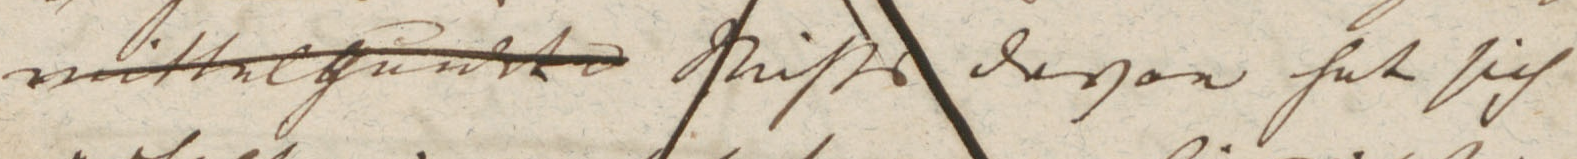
mittelpunkte Nichts davon hat sich
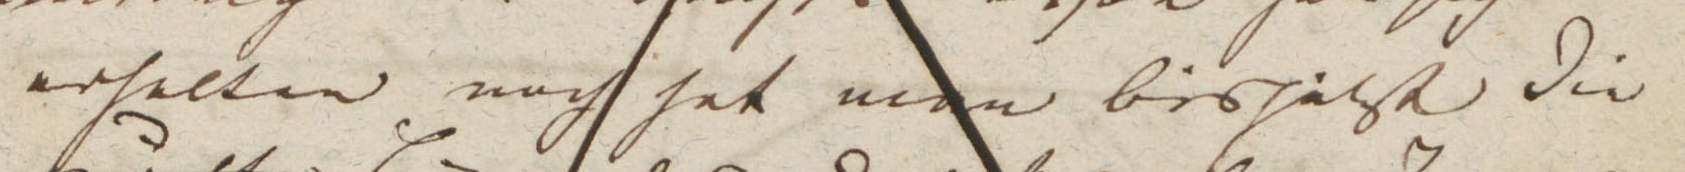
erhalten noch hat man bisjetzt die
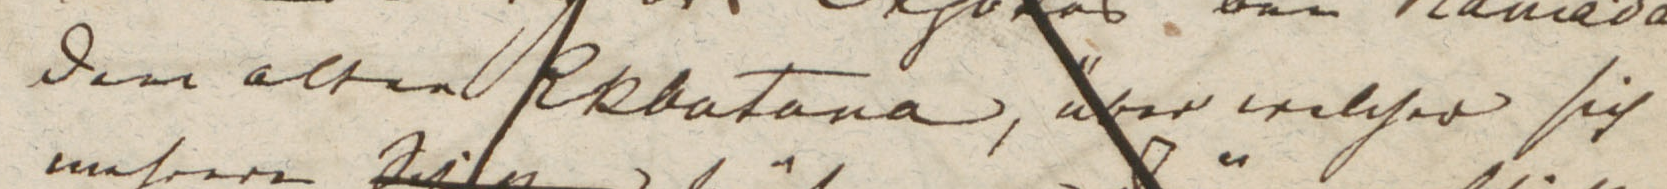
dem alten Ekbatana, über welcher sich
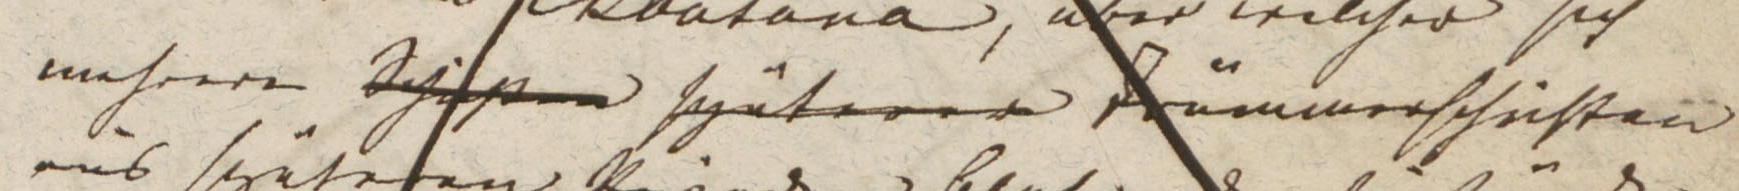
mehrere Schichten späterer Trümmerschichten
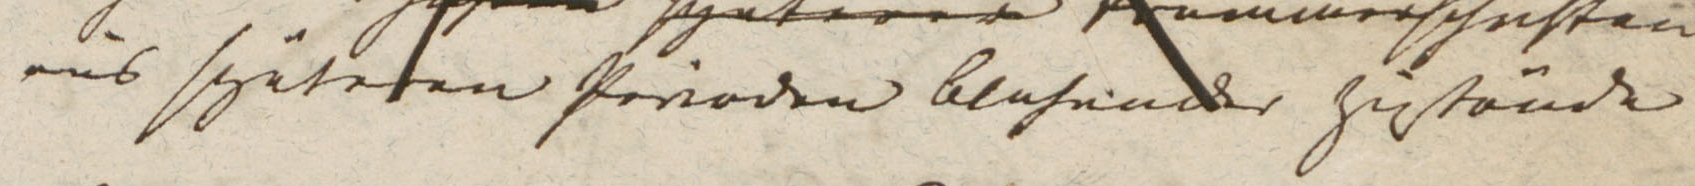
aus späteren Perioden blühender Zustände
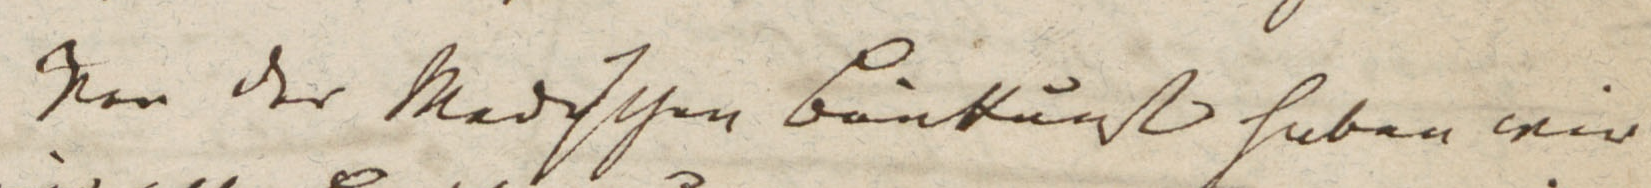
Von der Medischen Baukunst haben wir
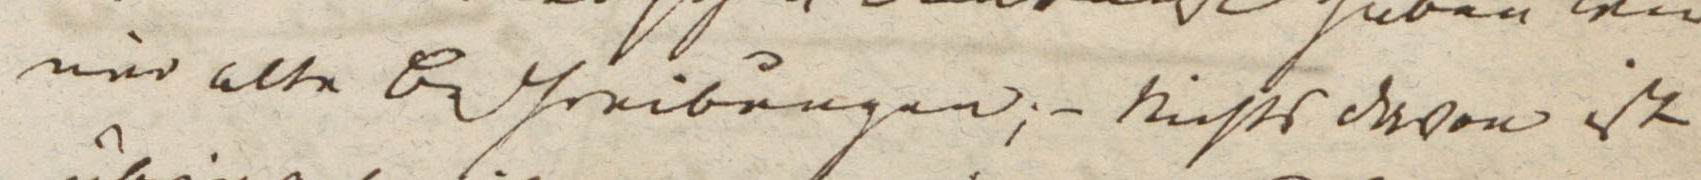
nur alte Beschreibungen; – Nichts davon ist
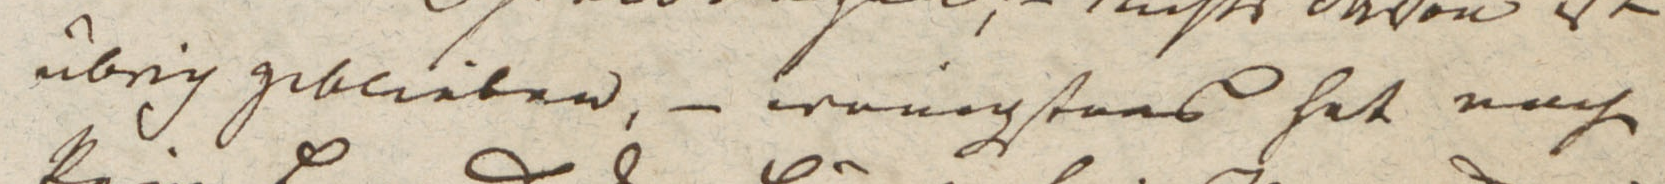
übrig geblieben, – wenigstens hat noch
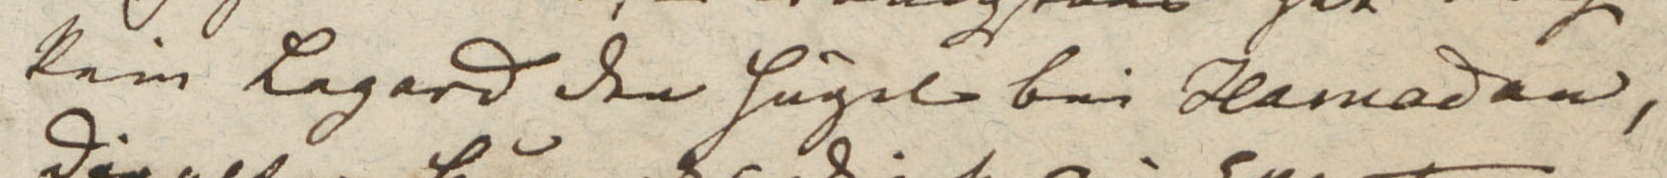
kein Layard den Hügel bei Hamadan,
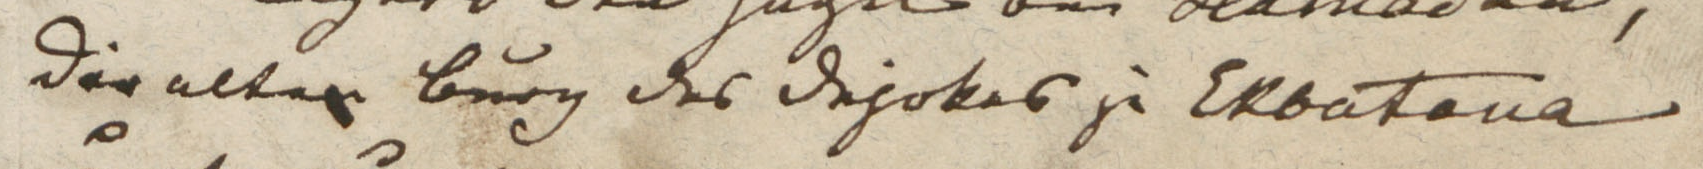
derie alte Burg des Dejokes zu Ekbatana
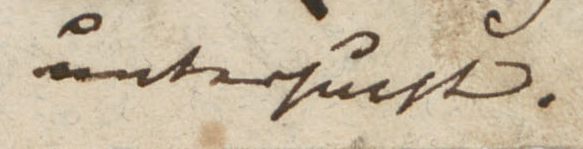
untersucht.
